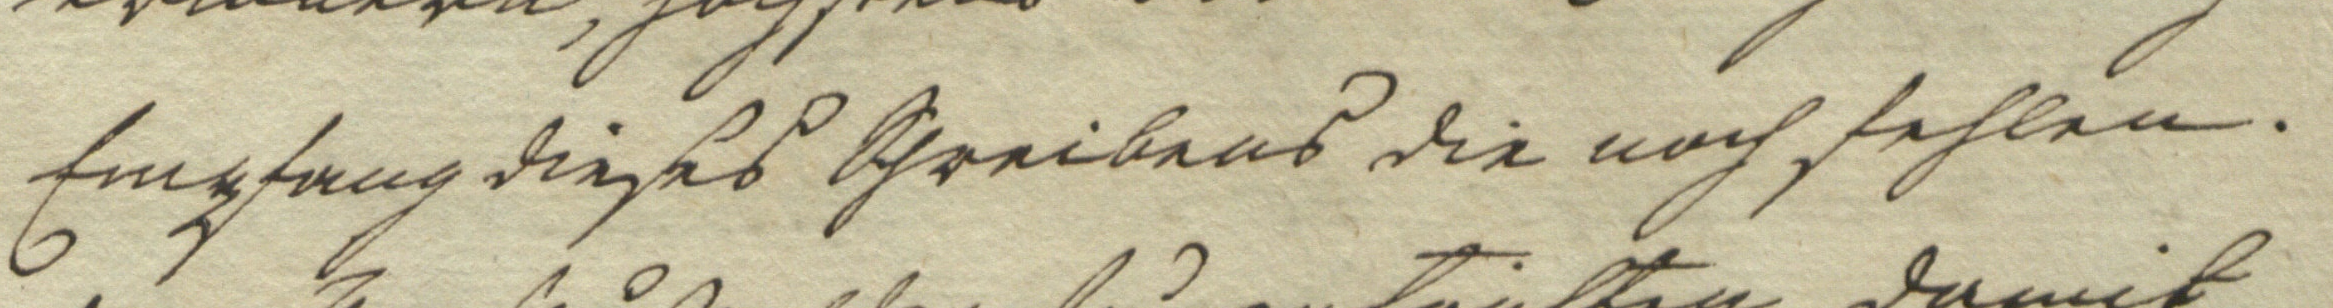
Empfang dieses Schreibens die noch fehlen¬
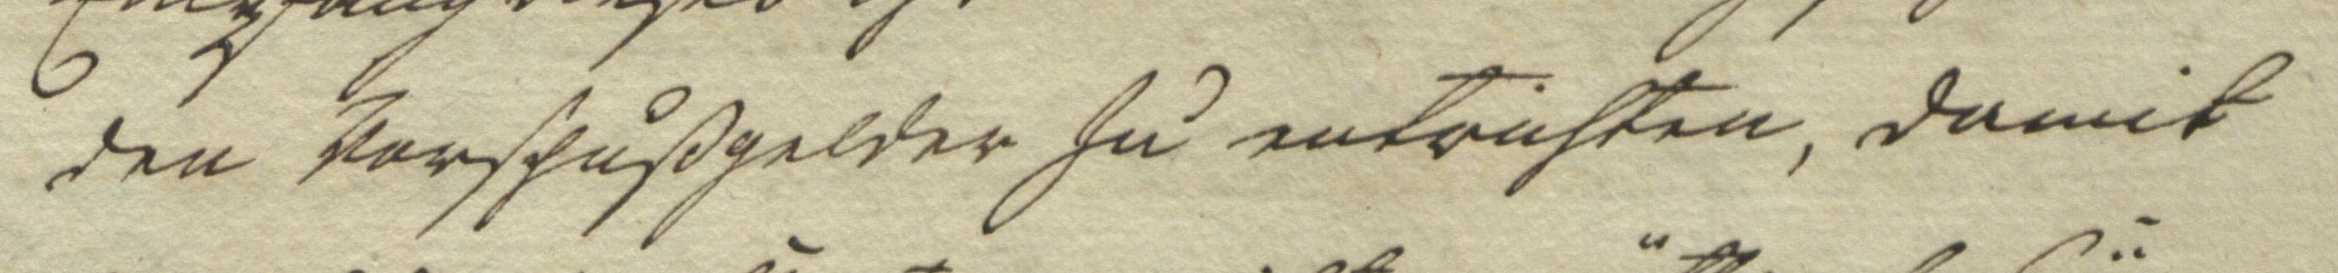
den Vorschußgelder zu entrichten, damit
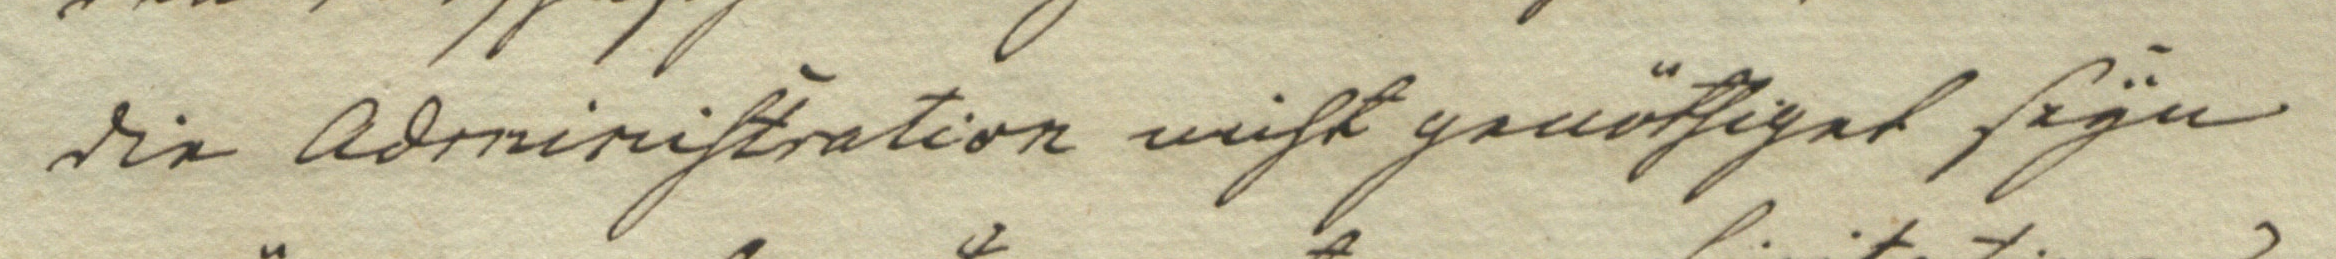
die Administration nicht genöthiget seÿn
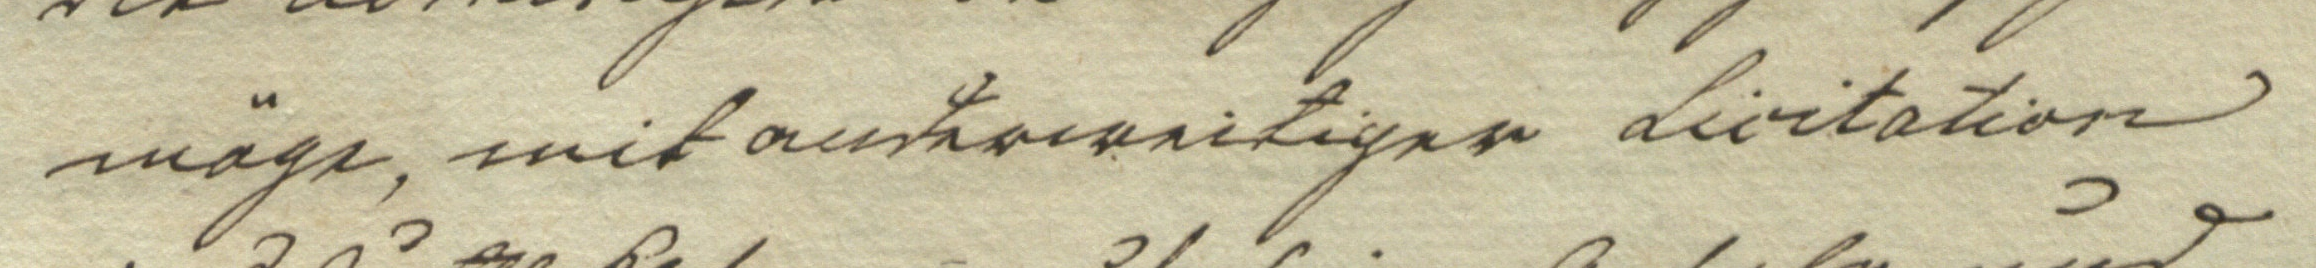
möge, mit anderweitiger Licitation
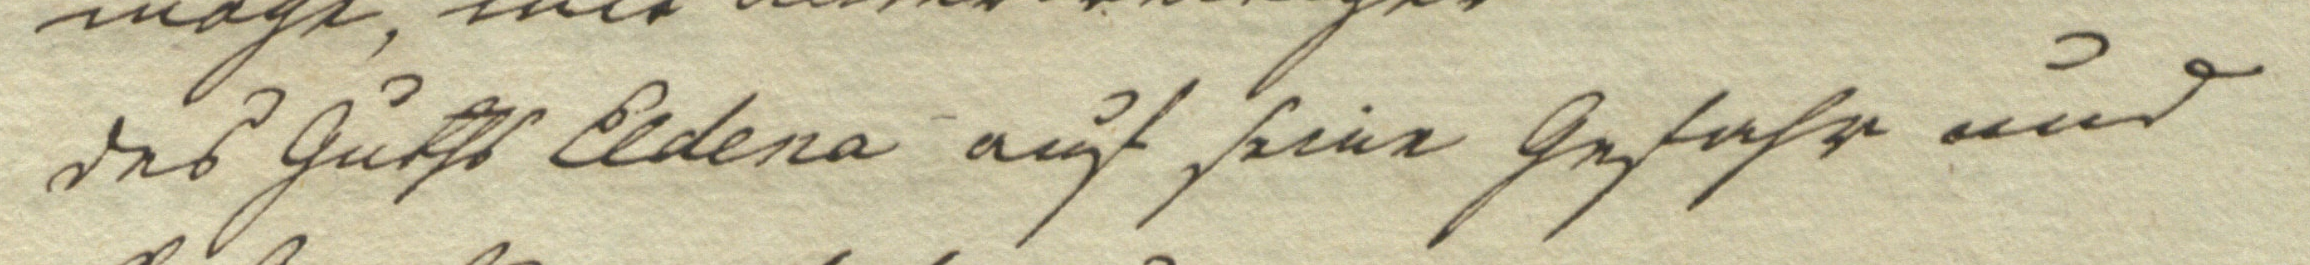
des Guths Eldena auf seine Gefahr und
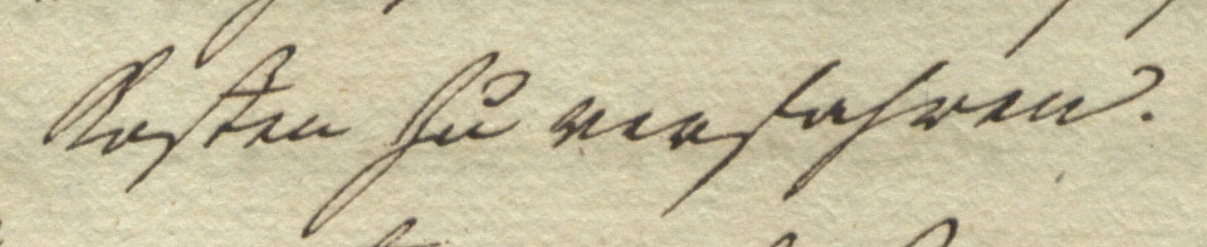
Kosten zu verfahren.
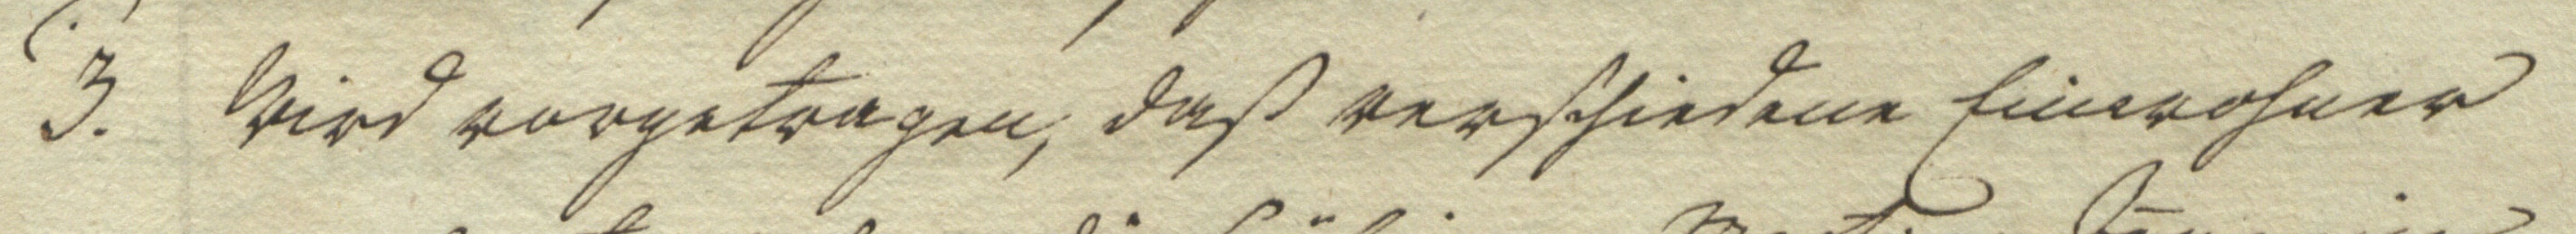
3. Wird vorgetragen, daß verschiedene Einwohner
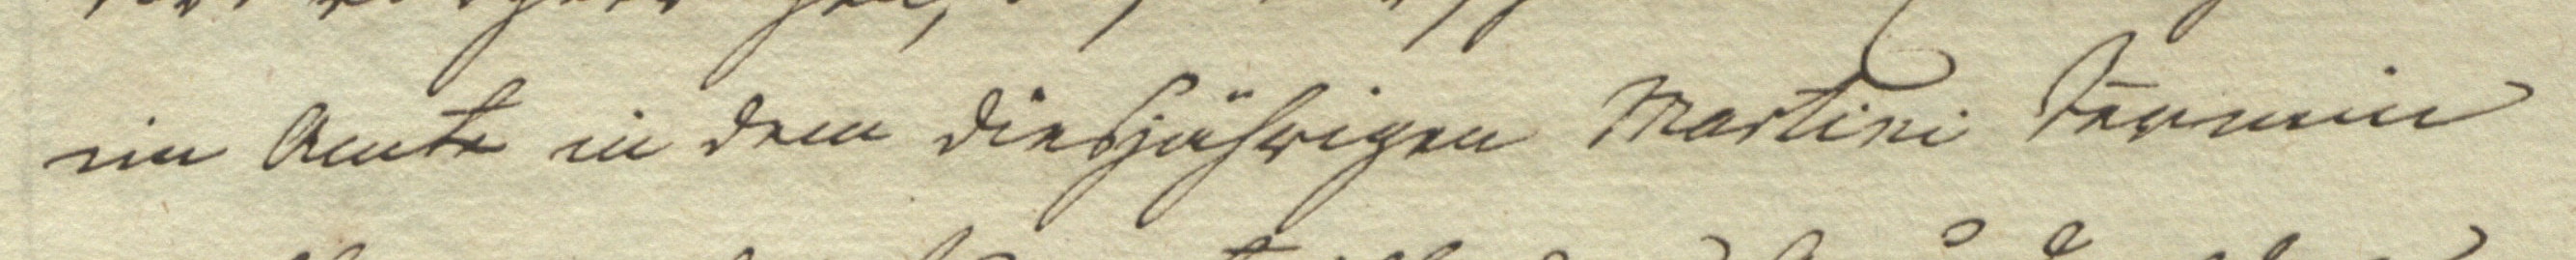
im Amte in dem diesjährigen Martini Termin
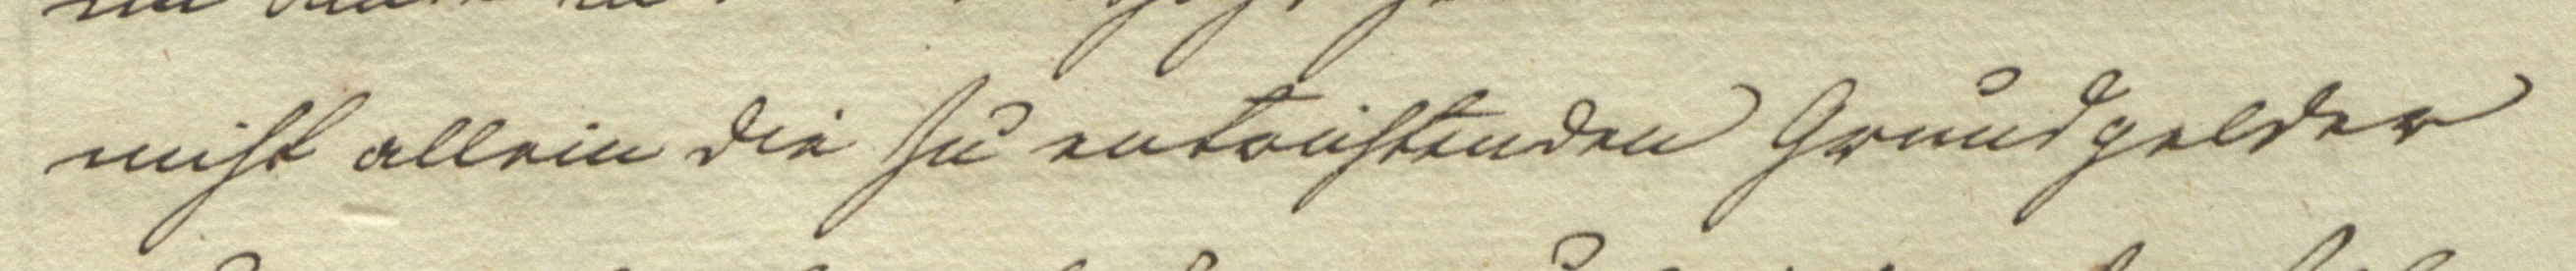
nicht allein die zu entrichtenden Grundgelder
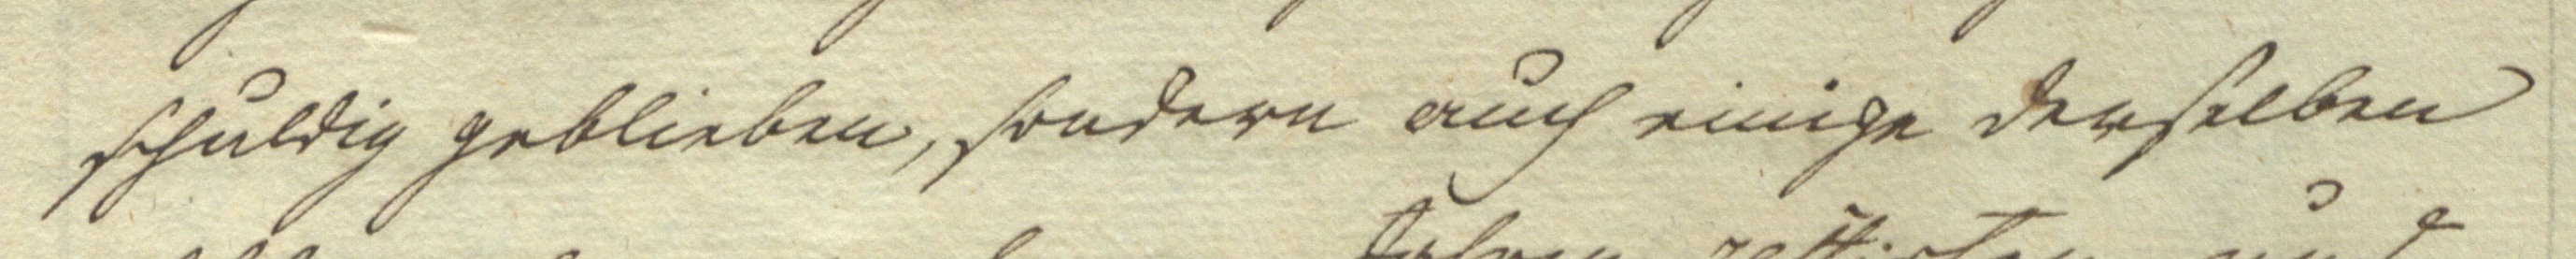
schuldig geblieben, sondern auch einige derselben
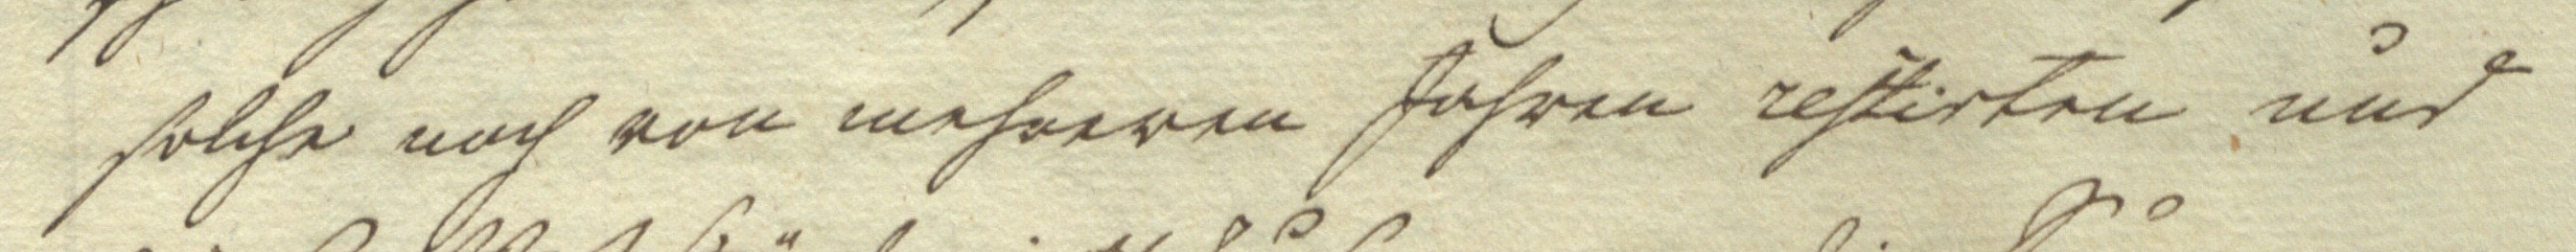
solche noch von mehreren Jahren restirten und
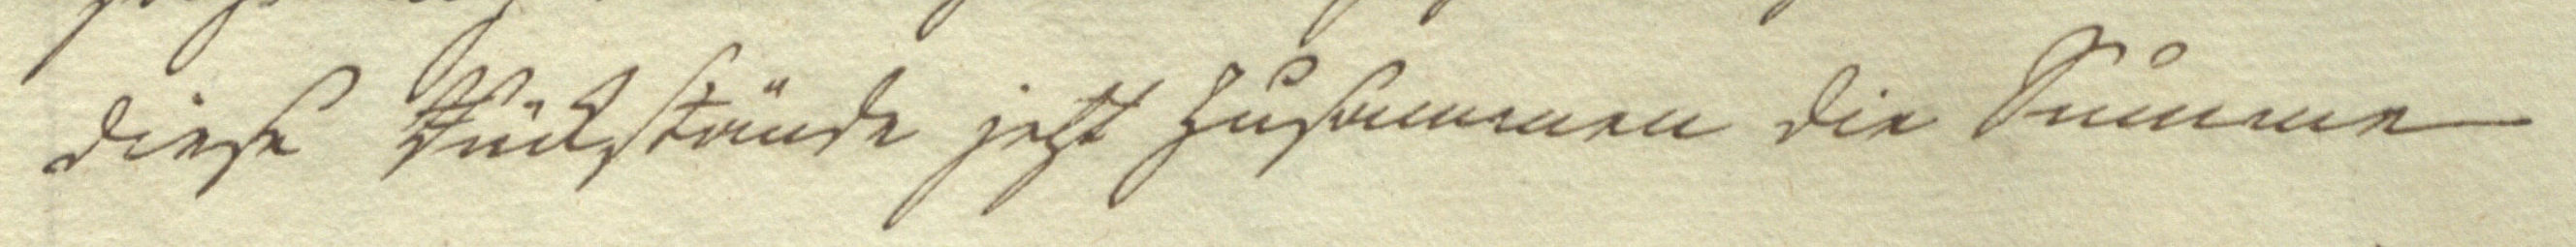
diese Rückstände jetzt zusammen die Summe
